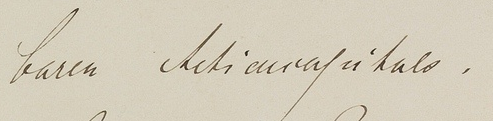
baren Actiencapitals.
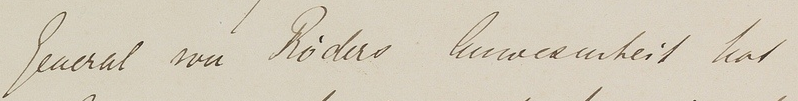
General von Röders Anwesenheit hat
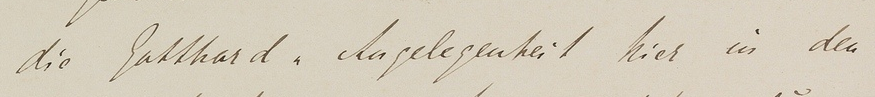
die Gotthard-Angelegenheit hier in den
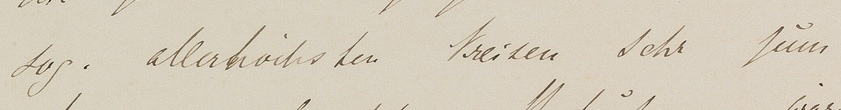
sog. allerhöchsten Kreisen sehr zum
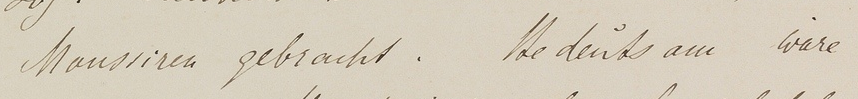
haussiren gebracht. Bedeutsam wäre
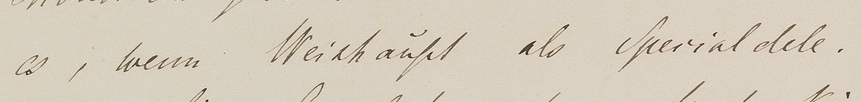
es, wenn Weishaupt als Specialdele-
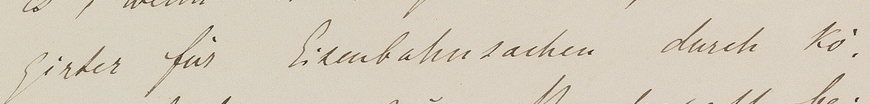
girter für Eisenbahnsachen durch kö-
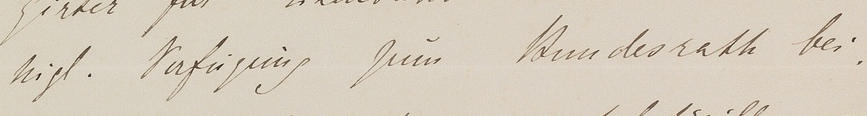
nigl. Verfügung zum Bundesrath bei-
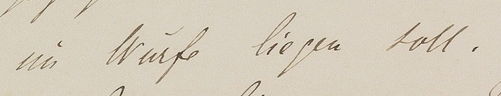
im Wurfe liegen soll.
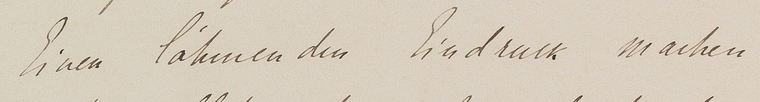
Einen lähmenden Eindruck machen
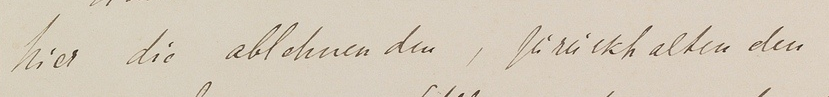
hier die ablehnenden, zurückhaltenden
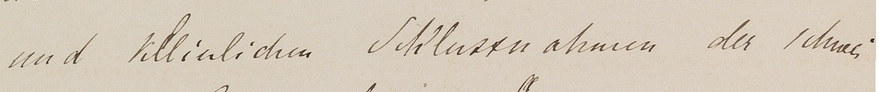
und kleinlichen Schlussnahmen der schwei-
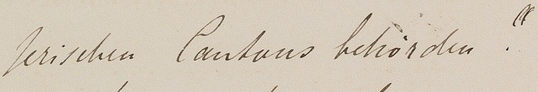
zerischen Cantonsbehörden.»
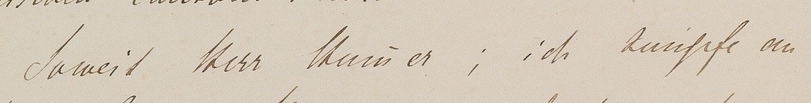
Soweit Herr Hammer; ich knüpfe an
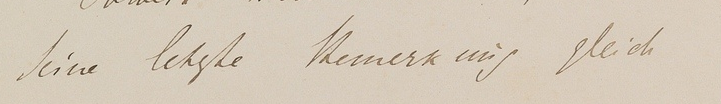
seine letzte Bemerkung gleich die
